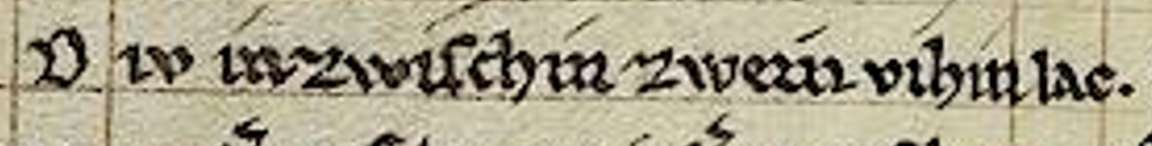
Div inzwiſchin zwein vihin lac.
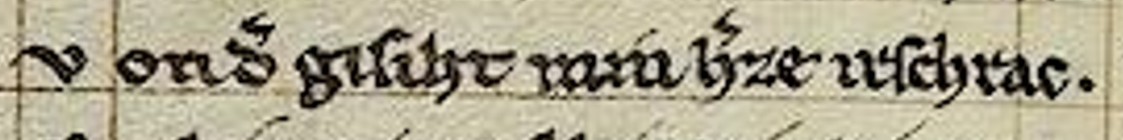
Von d(er) giſiht min h(er)ze irſchrac.
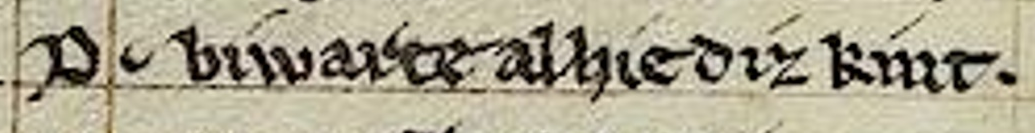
D(az) biwarte alhie diz kint.
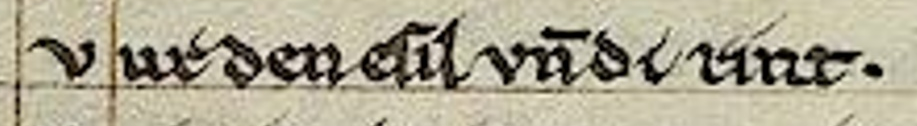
Vur den eſil vn(d) d(az) rint.
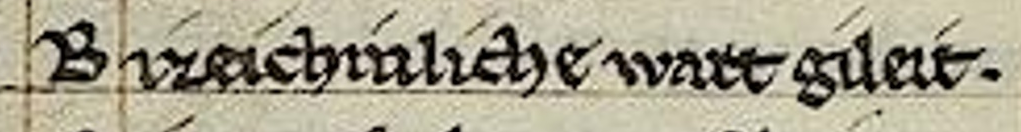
Bizeichinliche wart gileit.
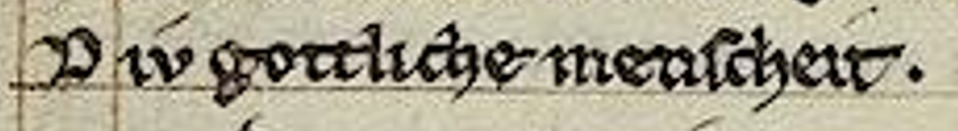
Div gottliche menſcheit.
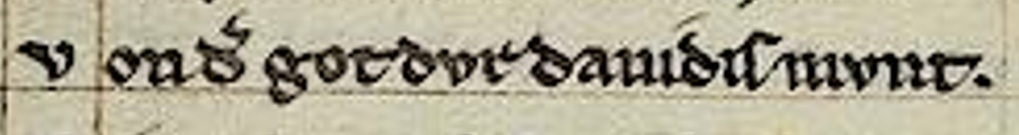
Von d(er) got dvr dauidiſ mvnt.
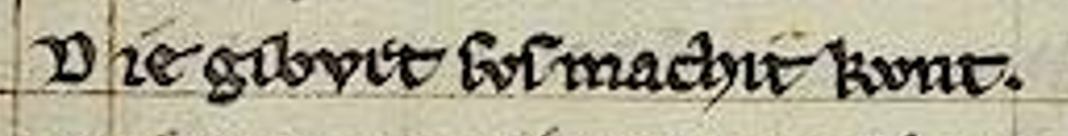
Die gibvrt ſvſ machit kvnt.
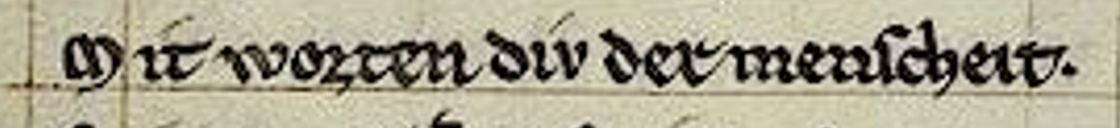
Mit worten div der menſcheit.
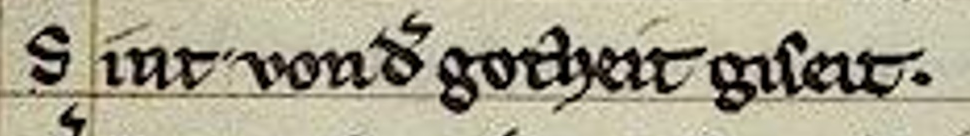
Sint von d(er) gotheit giſeit.
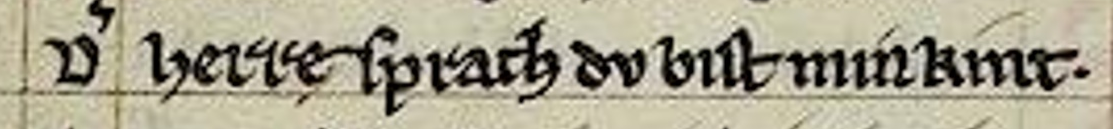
D(er) herre ſprach dv biſt min kint.
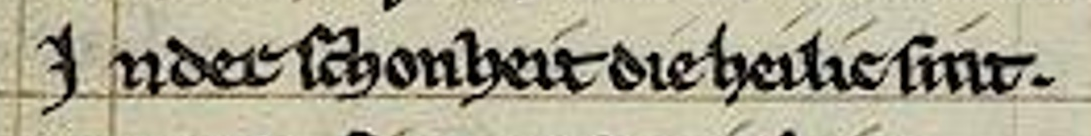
Inder ſchonheit die heilic ſint.
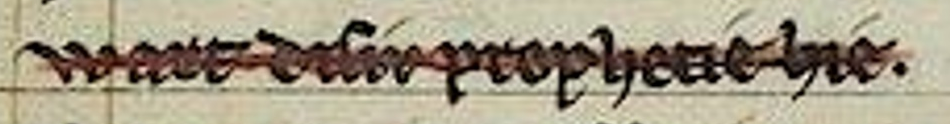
Wart diſiv prophetie hie.
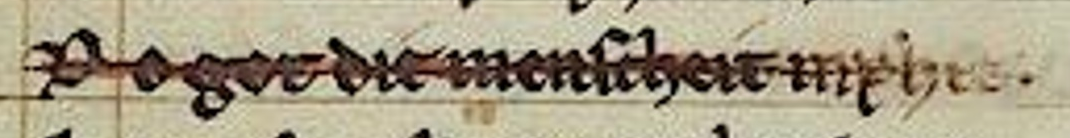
Do got die menſcheit inphxx.
